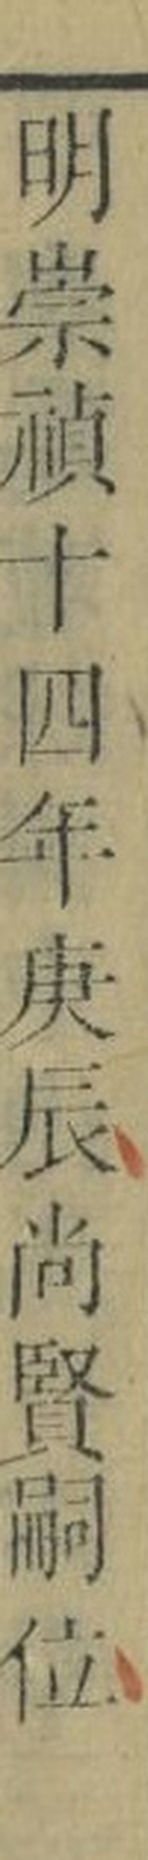明崇禎十四年庚辰尚賢嗣位
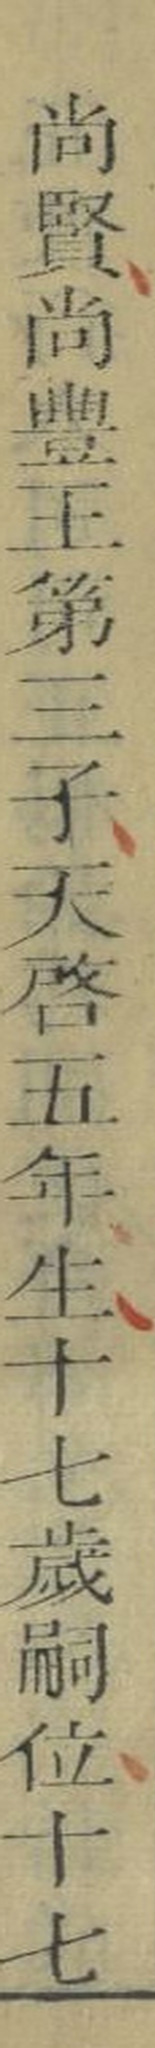尚賢尚豊王第三子天啓五年生十七歳嗣位十七
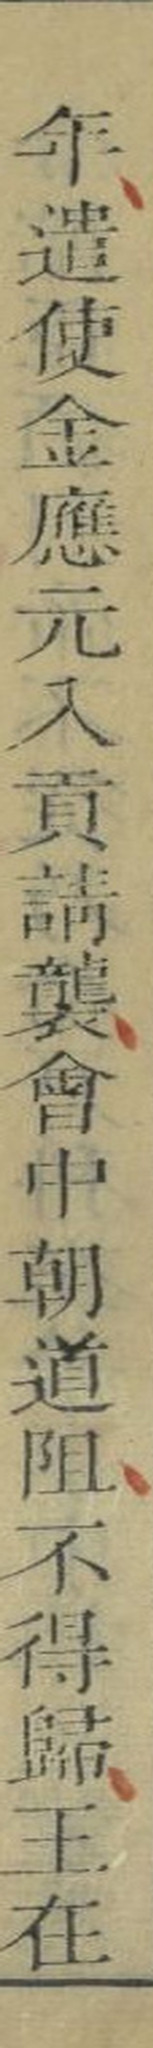年遣使金応元入貢請襲会中朝道阻不得帰王在
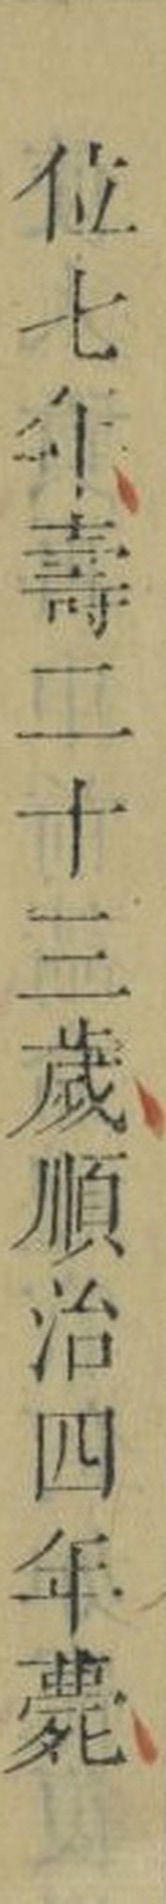位七年寿二十三歳順治四年薨
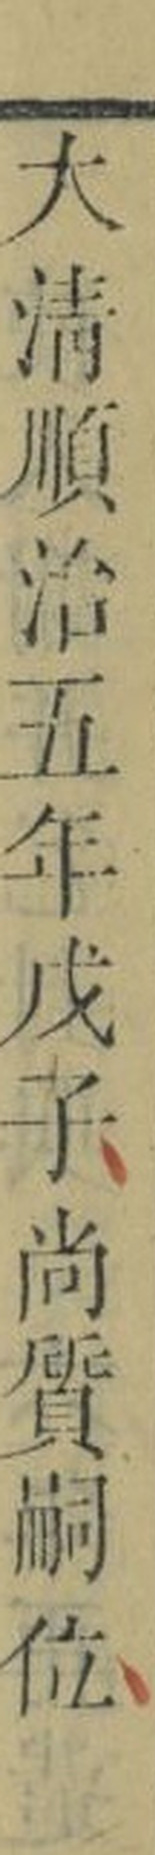大清順治五年戌子尚質嗣位
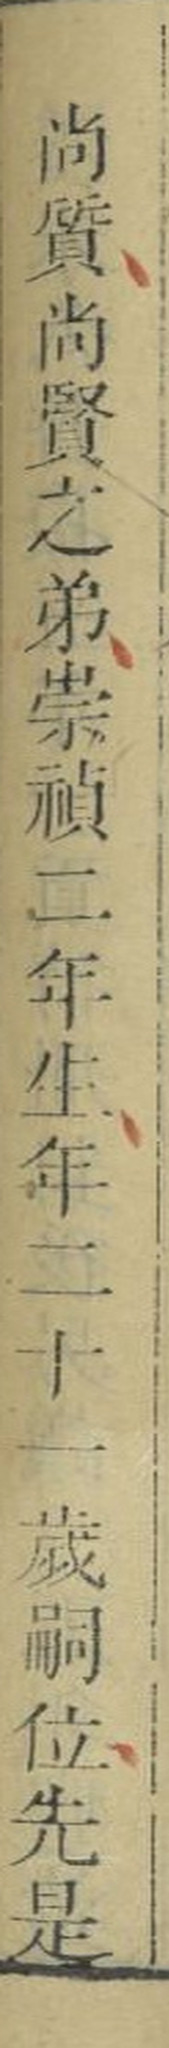尚質尚賢之弟崇禎二年生年二十一歳嗣位先是
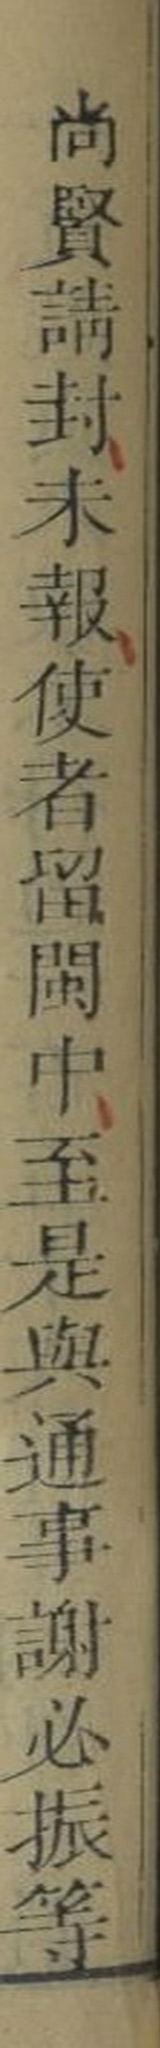尚賢請封未報使者留閩中至是与通事謝必振等
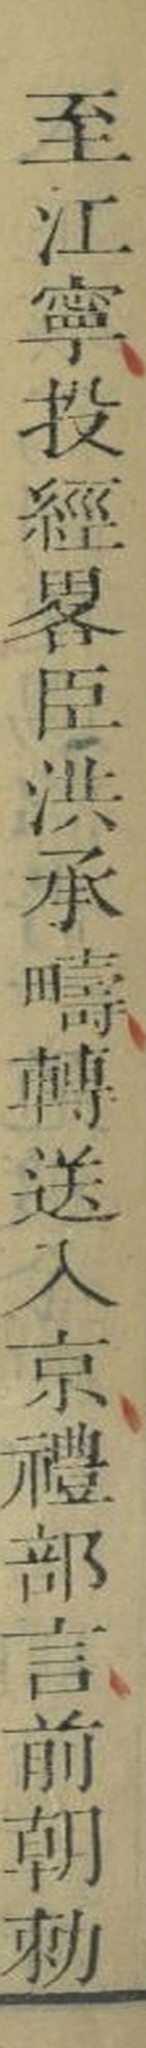至江寧投経略臣洪承疇転送入京礼部言前朝勅
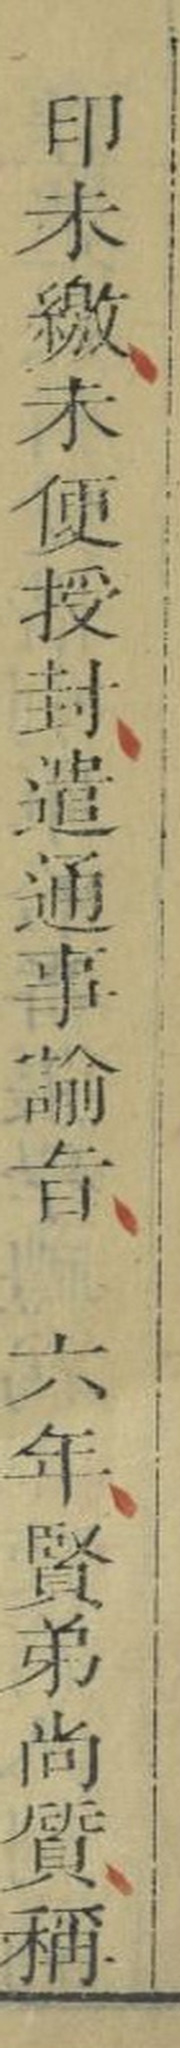印未繳未便授封遣通事諭旨六年賢弟尚質称
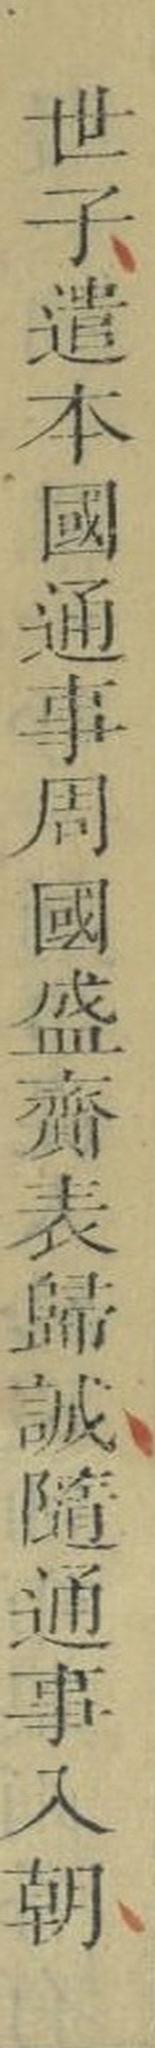世子遣本国通事周国盛齎表帰誠随通事入朝
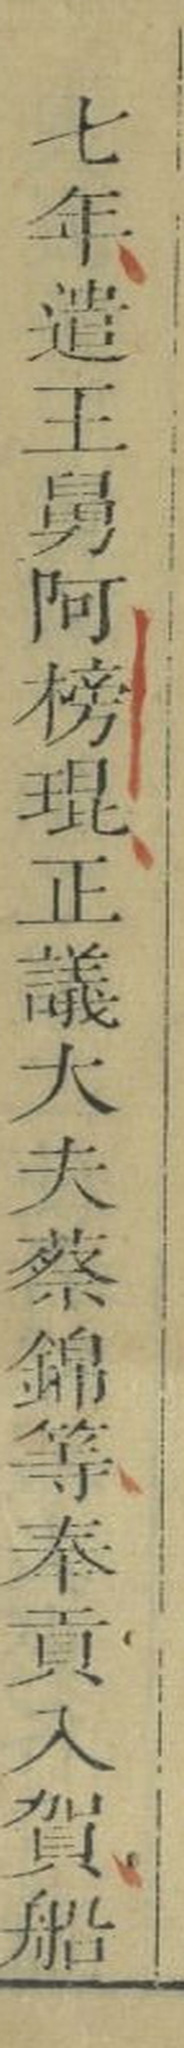七年遣王舅阿榜琨正議大夫蔡錦等奉貢入賀船
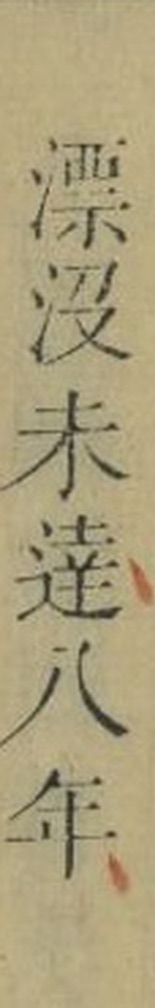漂没未達八年
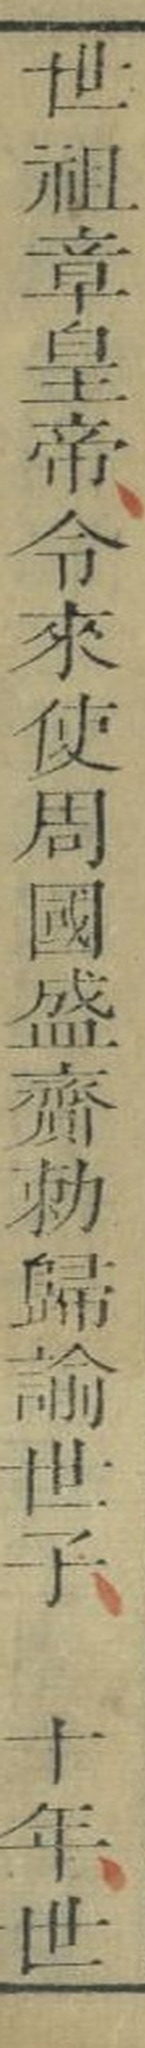世祖章皇帝令来使周国盛齎勅帰諭世子十年世
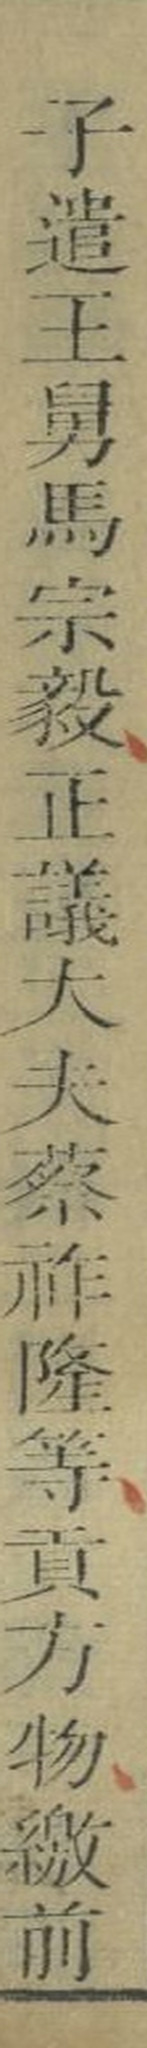子遣王舅馬宗毅正議大夫蔡祚隆等貢方物繳前
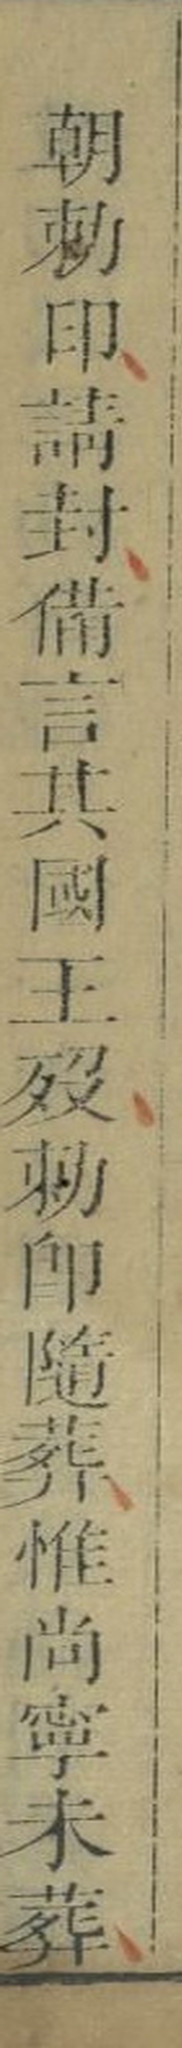朝勅印請封備言其国王歿勅即随葬惟尚寧未葬

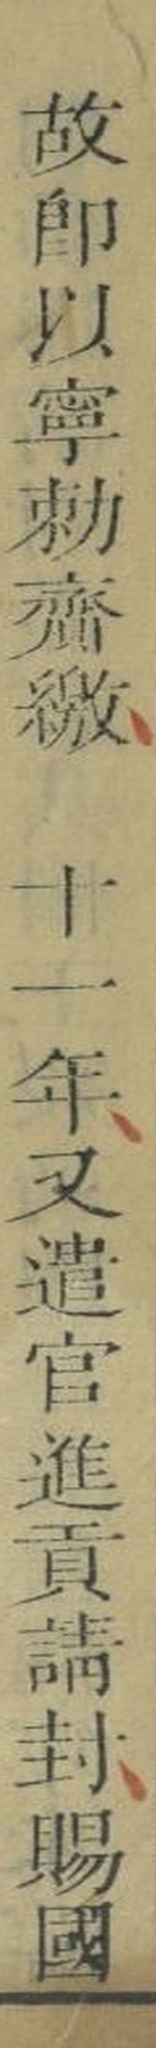故即以寧勅齎繳十一年又遣官進貢請封賜国
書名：中山伝信録 巻三
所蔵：University of the Ryukyus Library
